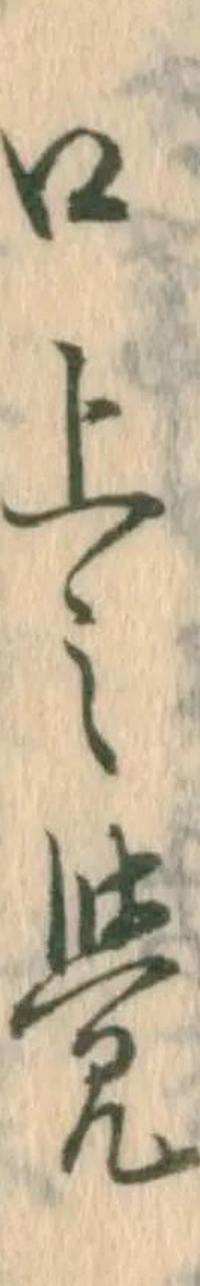口上之覚
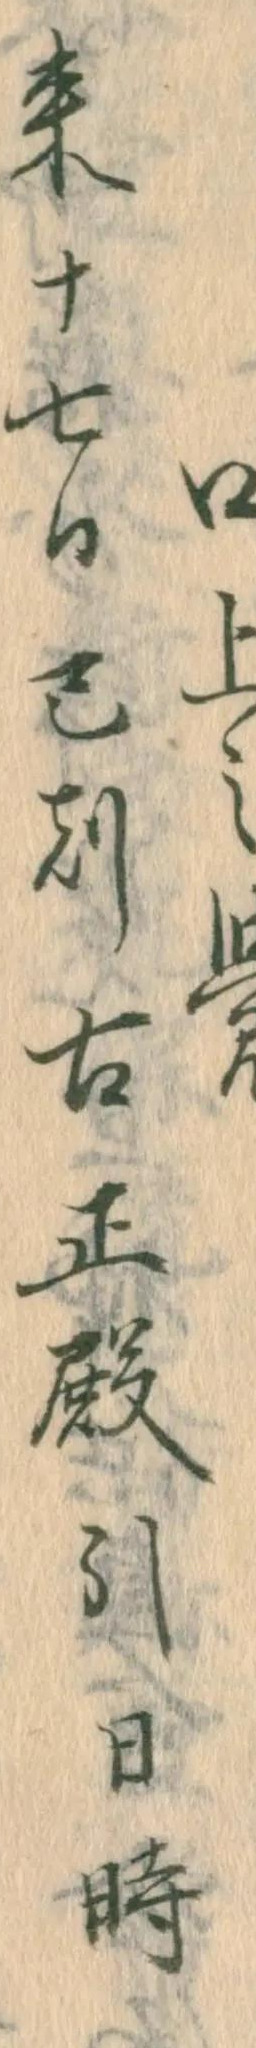来十七日巳刻古正殿引日時
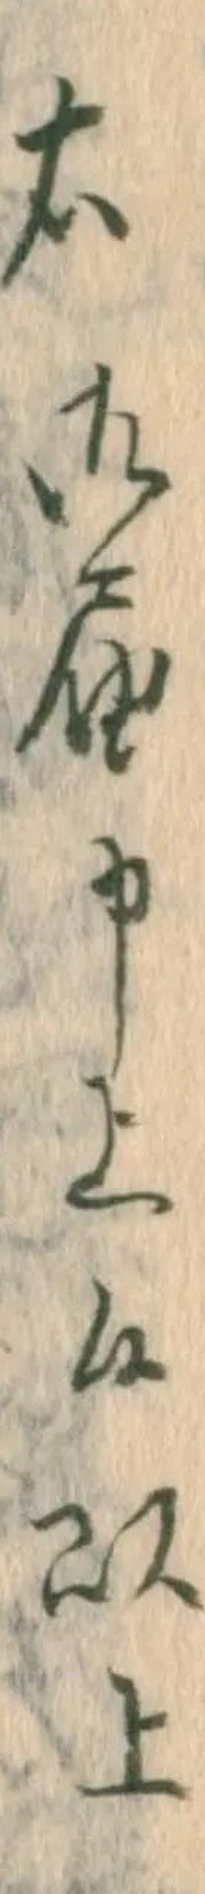右御届申上候以上
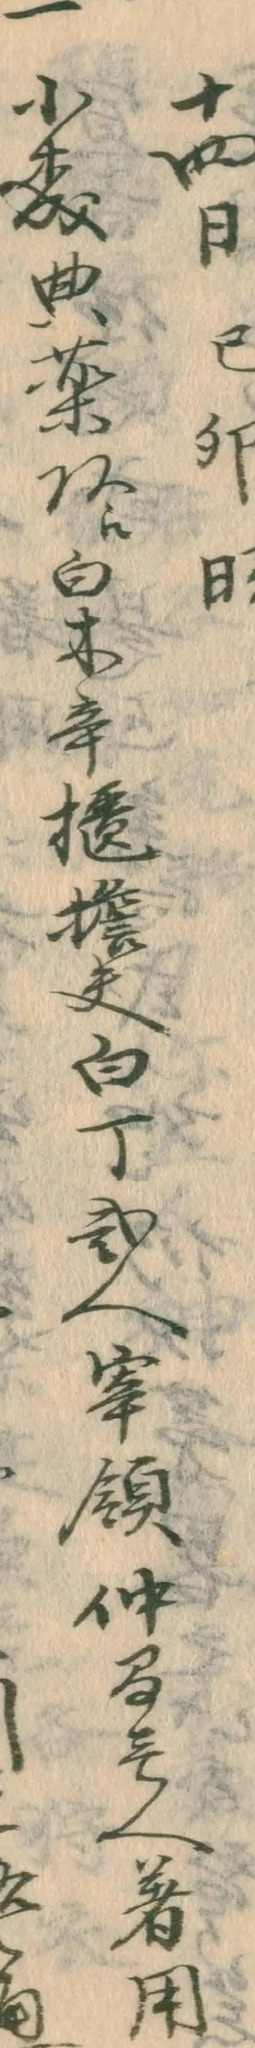一小森典薬頭江白木辛櫃担夫白丁弐人宰領仲間壱人着用
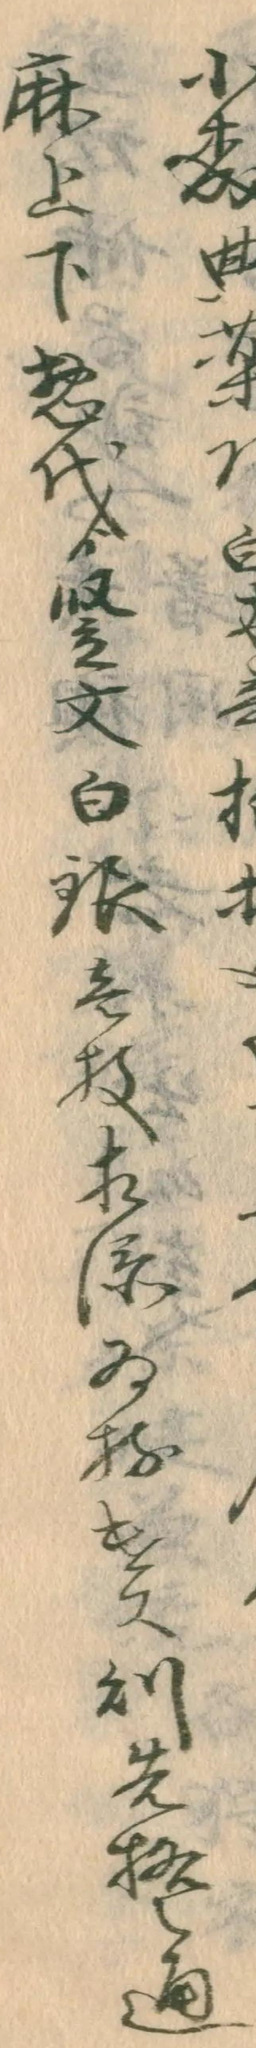麻上下惣代ゟ竪文白銀壱枚相添為持遣ス則先格之通
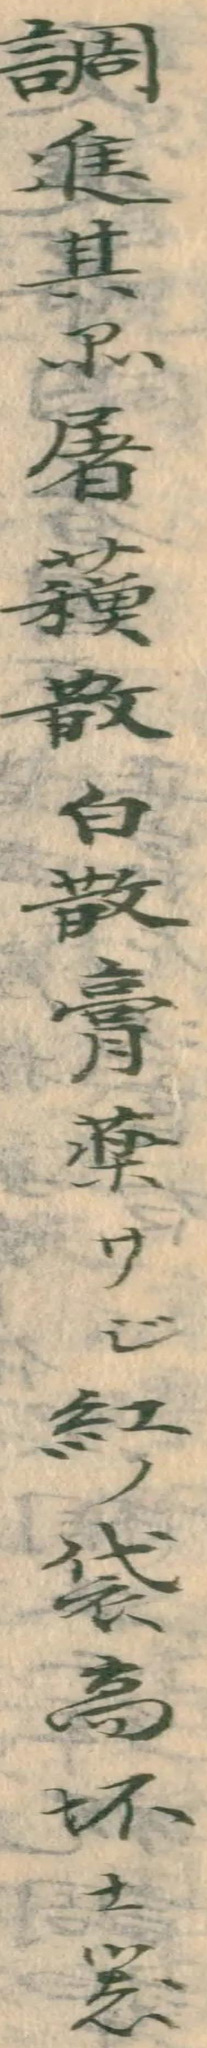調進其品屠蘇散白散膏薬サジ紅ノ袋高杯土器
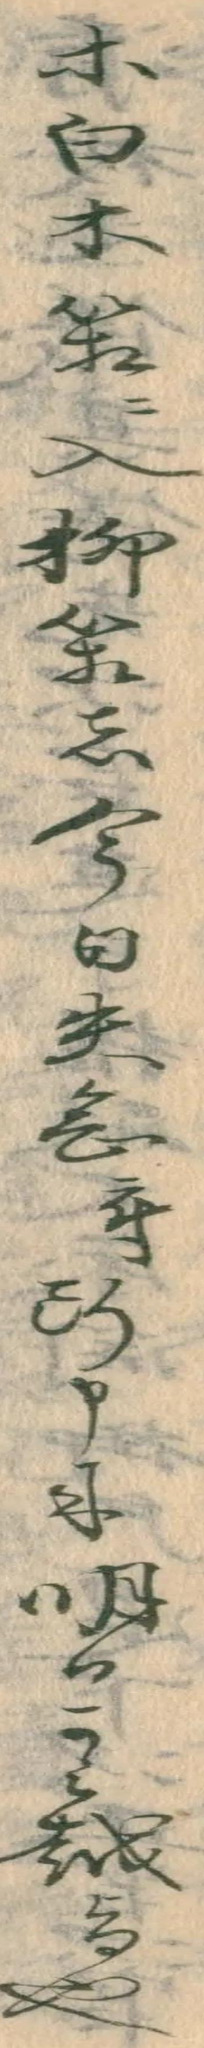等白木箱ニ入柳箱は今日失念ニ付断申来明日可被越旨也
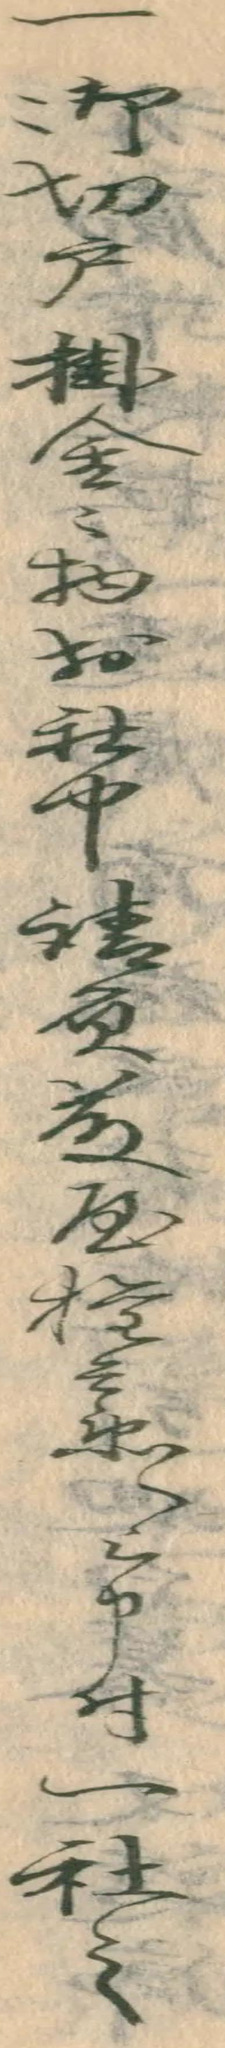一御切戸掛金々物於社中請負藤屋権兵衛へ被申付一社之
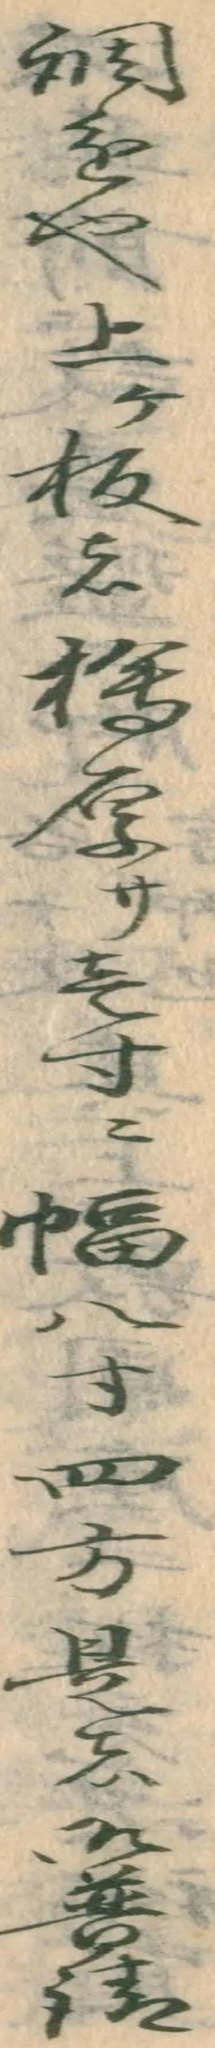調進也上ケ板は檜厚サ壱寸ニ幅八寸四方是は御普請
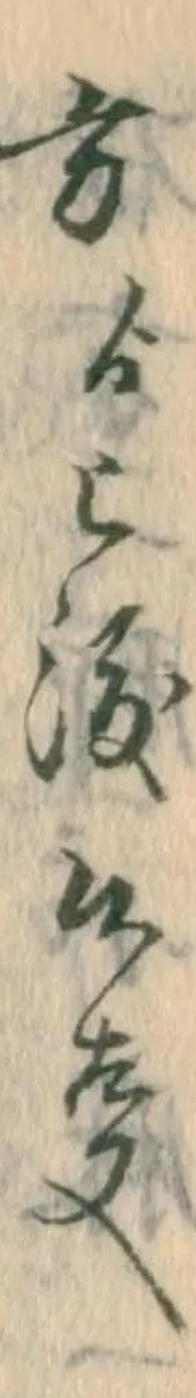方ゟ被渡候事
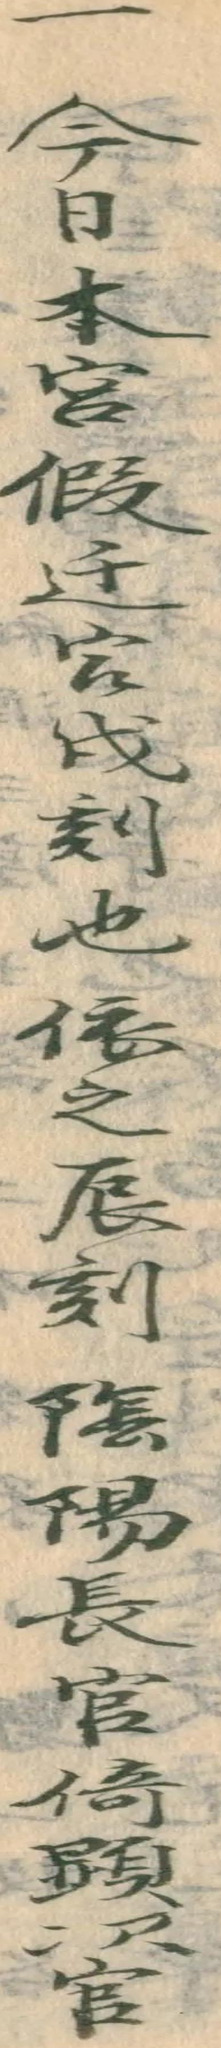一今日本宮仮迁宮戌刻也依之辰刻陰陽長官倚顕次官
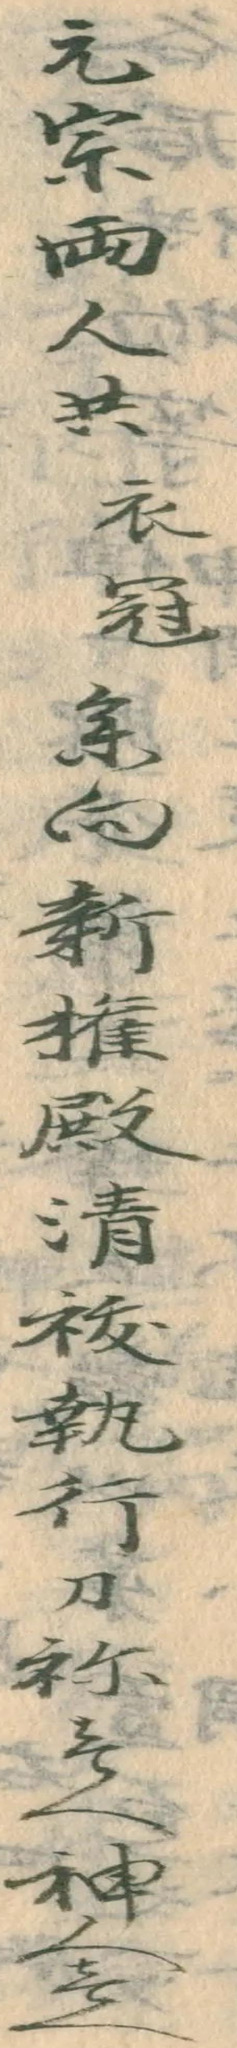元宗両人共衣冠参向新権殿清祓執行刀祢壱人神人壱人
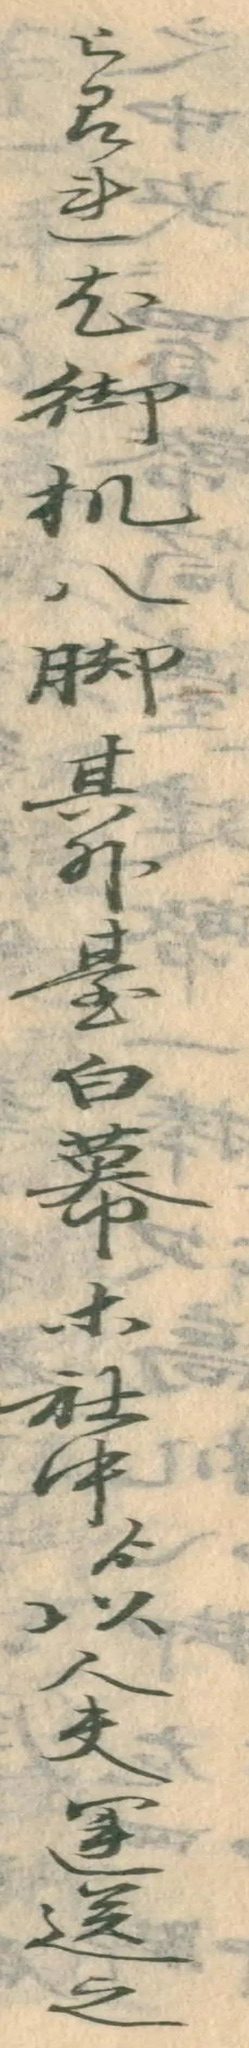被召連尤御机八脚其外台白幕等社中ゟ以人夫運送之
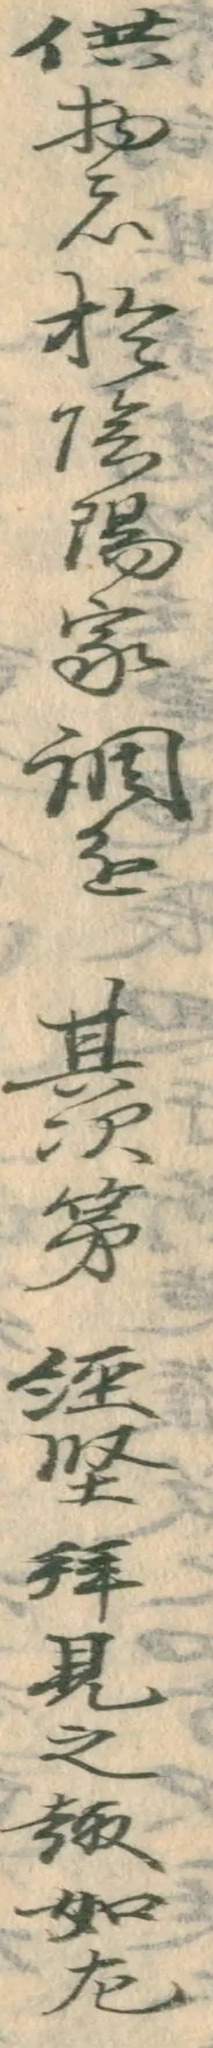供物は於陰陽家調進其次第経堅拝見之趣如左
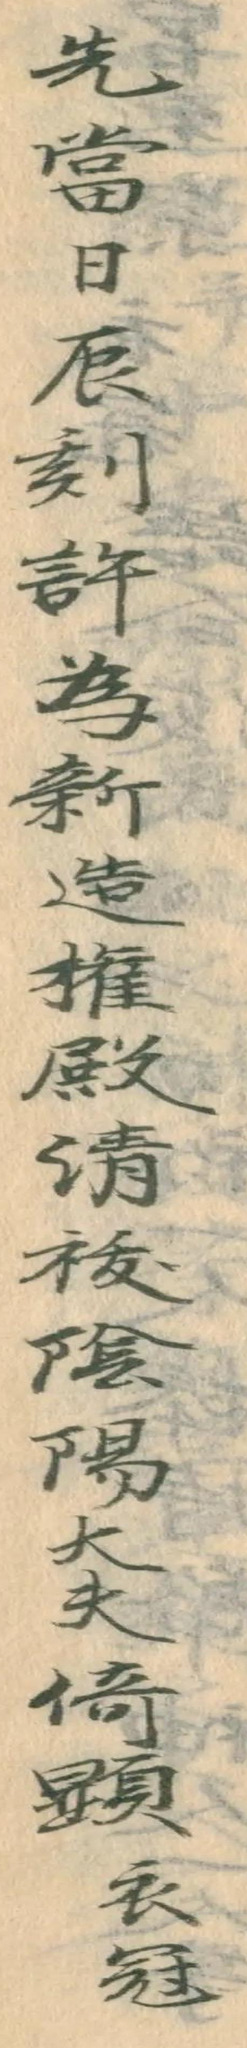先当日辰刻許為新造雑殿清祓陰陽大夫倚顕衣冠

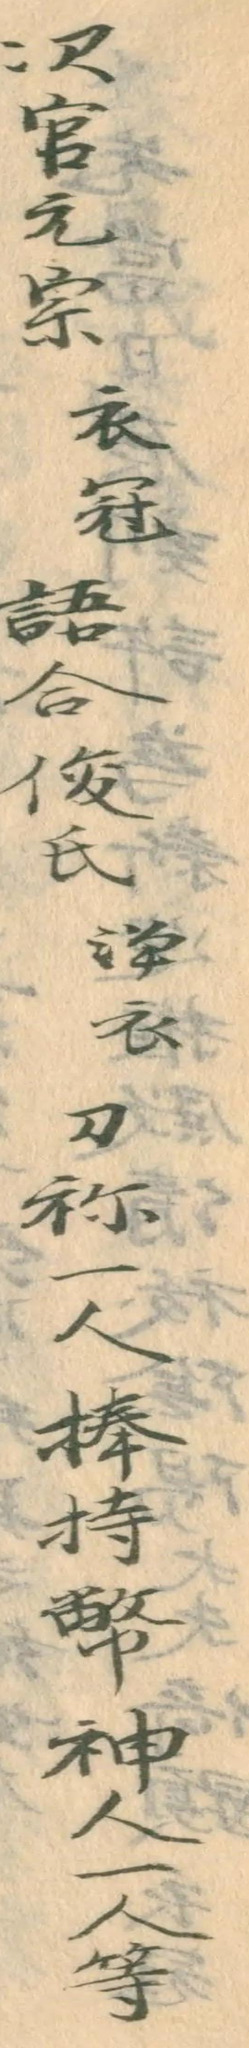次官元宗衣冠語合俊氏浄衣刀祢一人捧持幣神人一人等
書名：賀茂社記録. 第17冊
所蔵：国立国会図書館 National Diet Library, JAPAN
